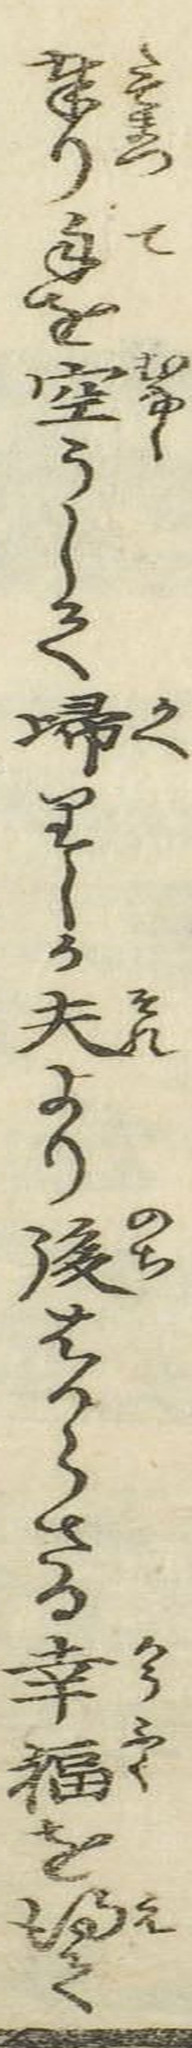奉り手を空うして帰りしか夫より後はからさる幸福を得て
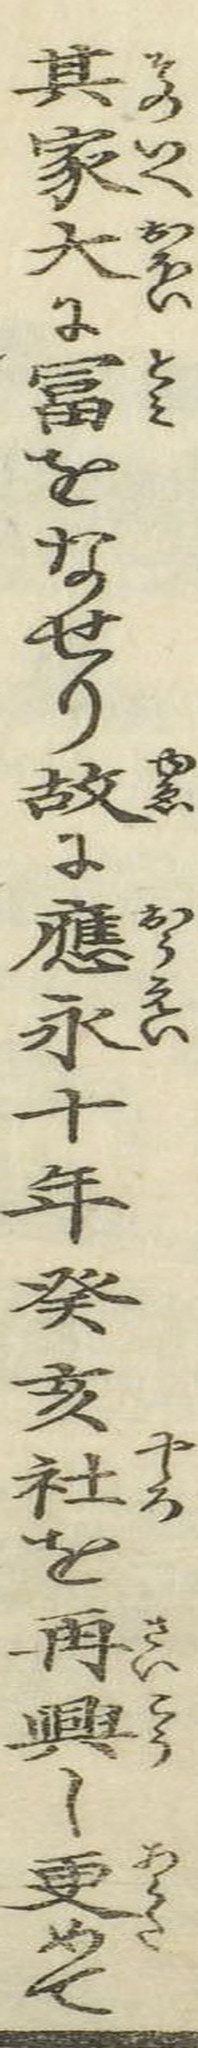其家大に富をなせり故に応永十年癸亥社を再興し更めて
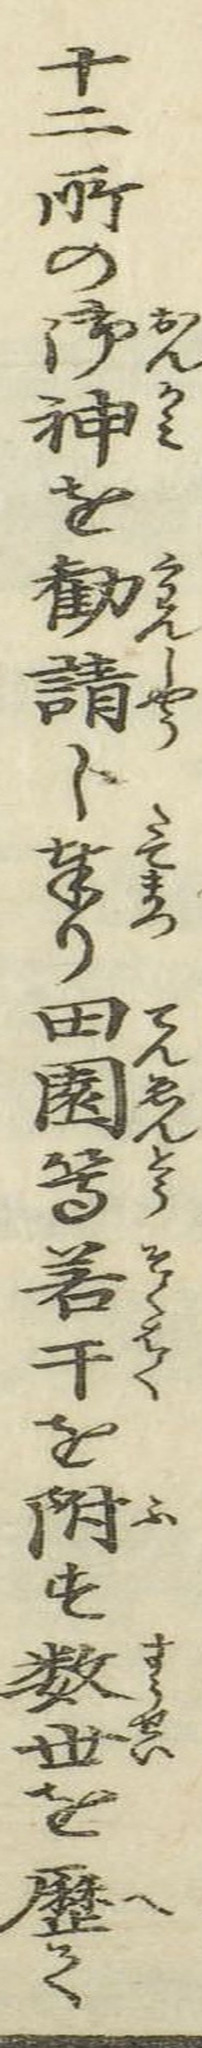十二所の御神を勧請し奉り田園等若干を附す数世を歴て
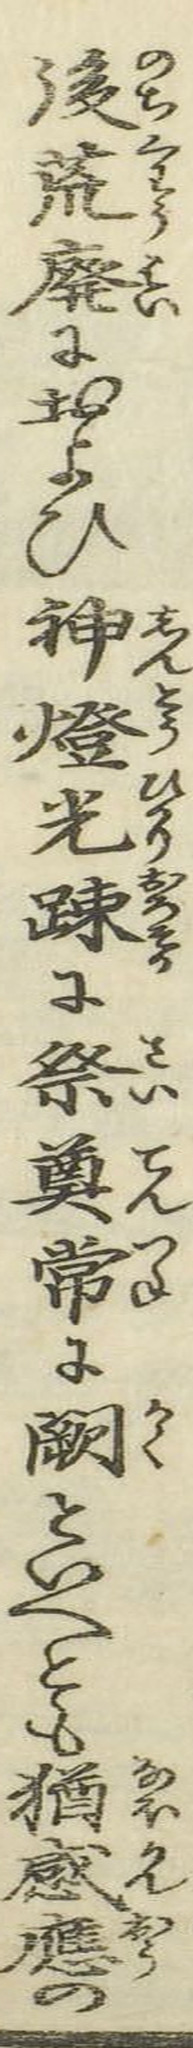後荒廃におよひ神燈光疎に祭奠常に闕といへとも猶感応の
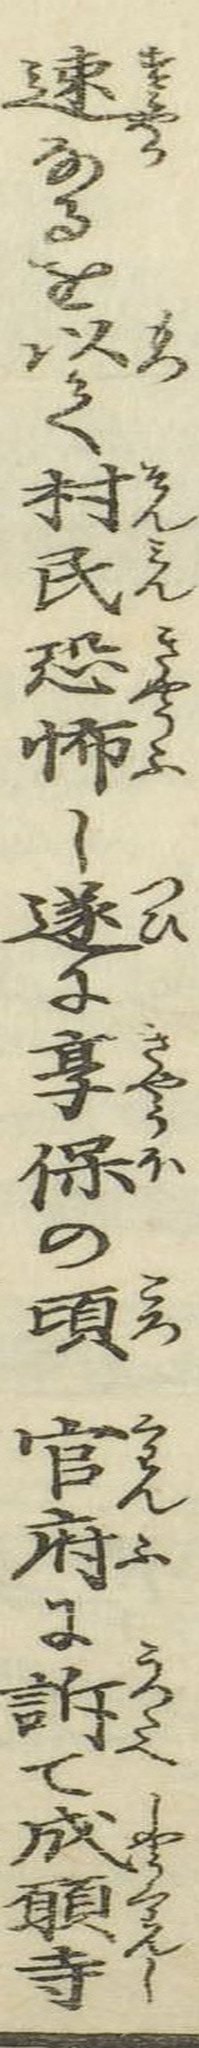速なるを以て村民恐怖し遂に享保の頃官府に訴て成願寺
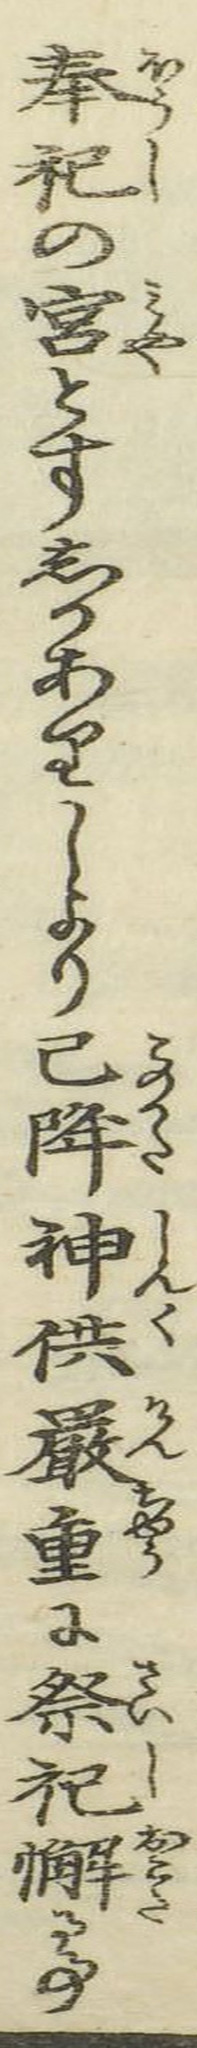奉祀の宮とすしかありしより已降神供厳重に祭祀懈る事
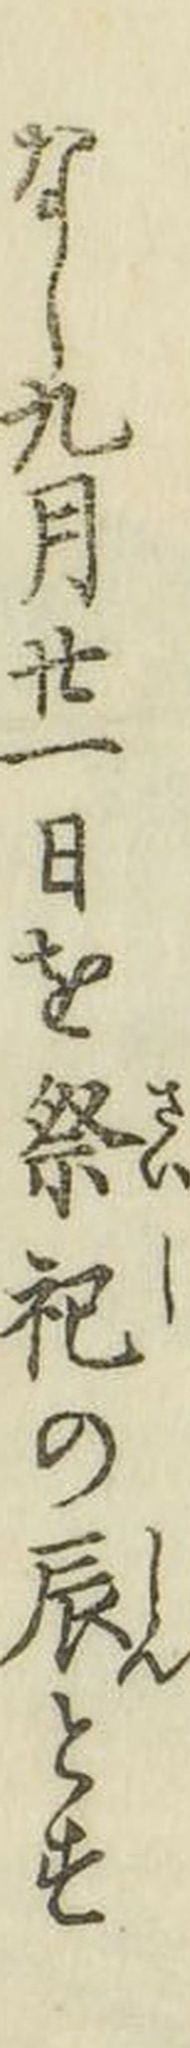なし九月廿一日を祭祀の辰とす
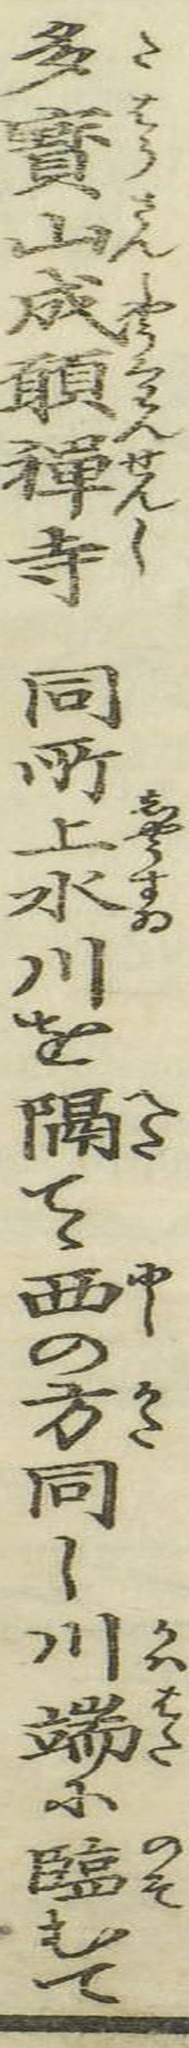多宝山成願禅寺同所上水川を隔てゝ西の方同し川端に臨むて
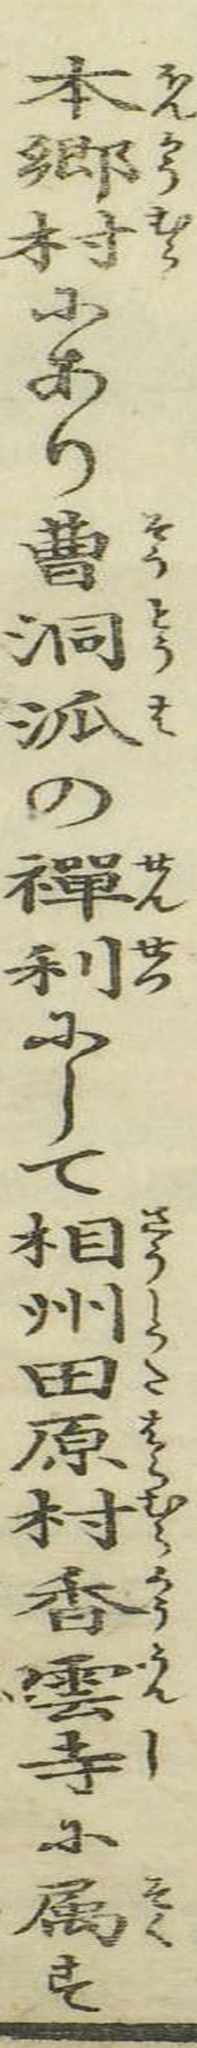本郷村にあり曹洞派の禅刹にして相州田原村香雲寺に属す
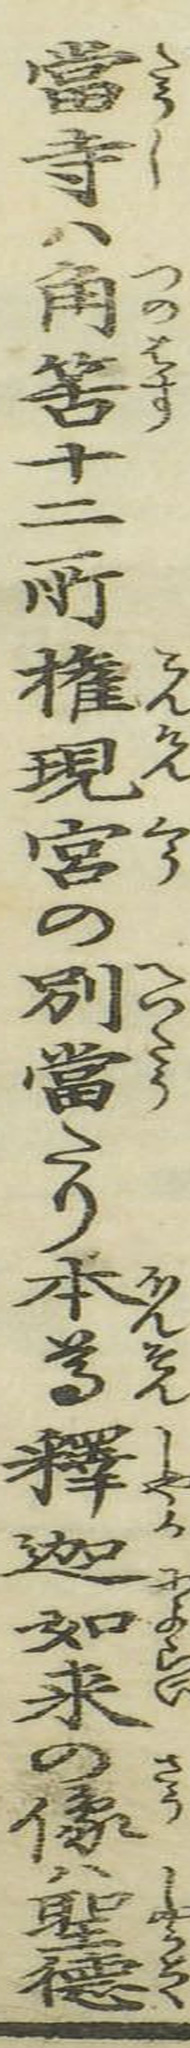当寺は角筈十二所権現宮の別当たり本尊釈迦如来の像は聖徳

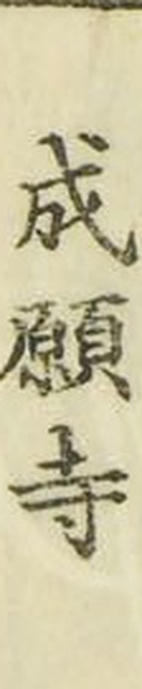成願寺
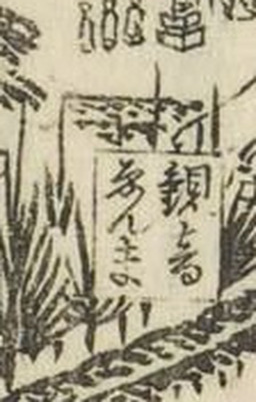ゑんま

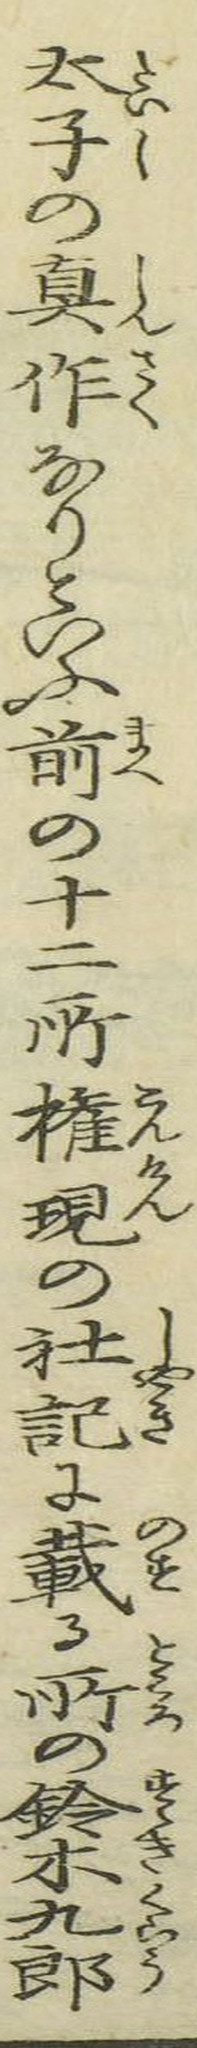太子の真作なりといふ前の十二所権現の社記に載る所の鈴木九郎
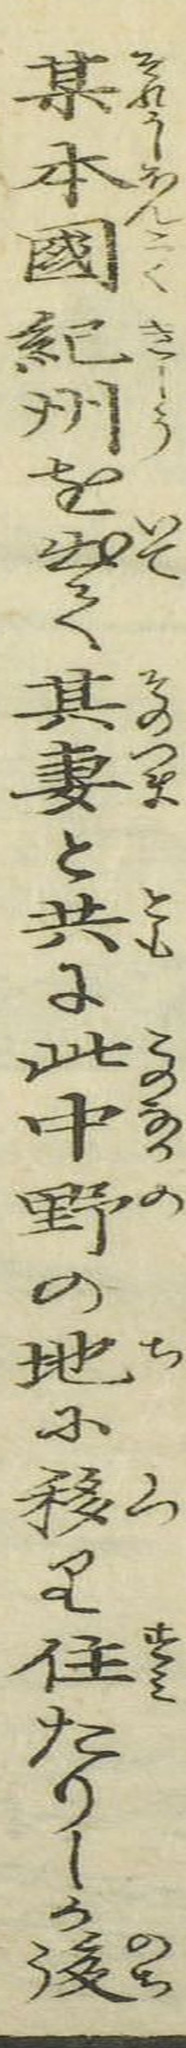某本国紀州を出て其妻と共に此中野の地に移り住たりしか後
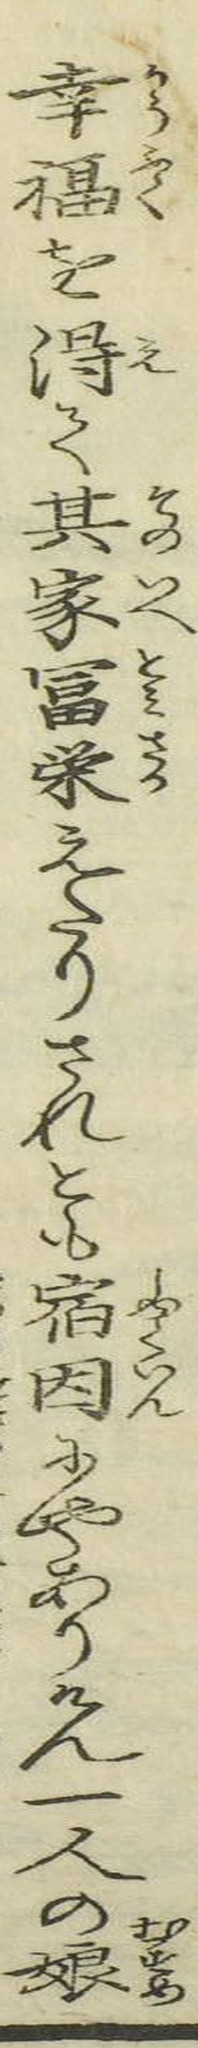幸福を得て其家富栄えたりされとも宿因にやありけん一人の娘
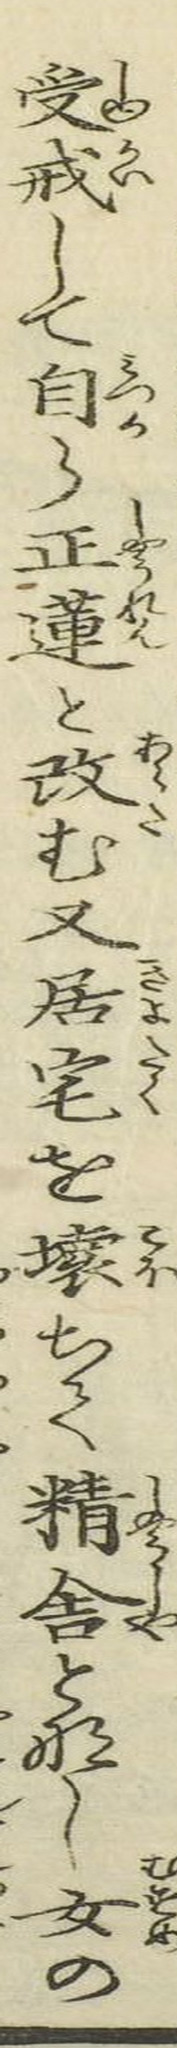受戒して自ら正蓮と改む又居宅を壊ちて精舎となし女の
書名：江戸名所図会 20巻 巻之11
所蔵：東京学芸大学教育コンテンツアーカイブ
